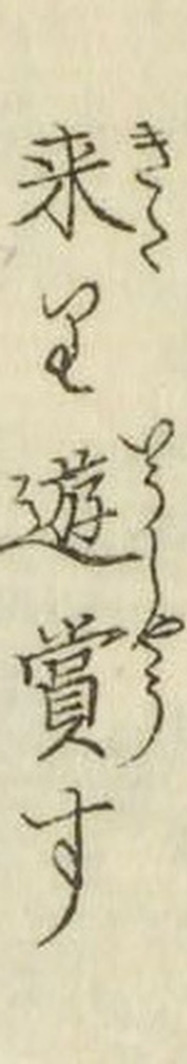来り游賞す
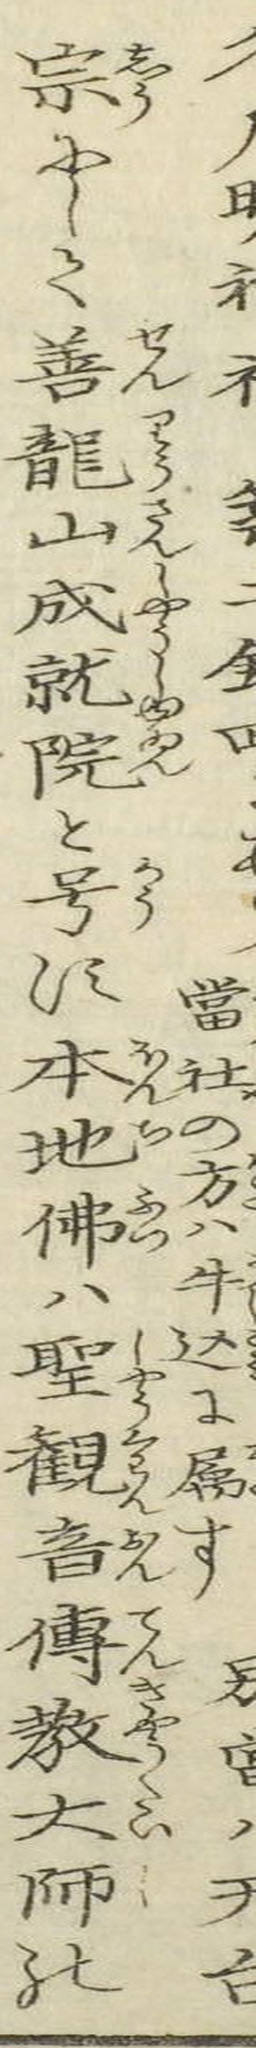宗にして善竜山成就院と号す本地仏は聖観音伝教大師の
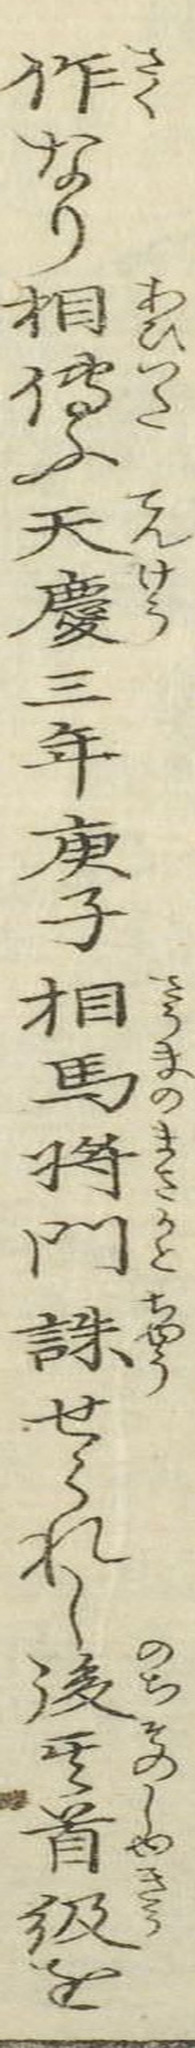作なり相伝ふ天慶三年庚子相馬将門誅せられし後其首級を
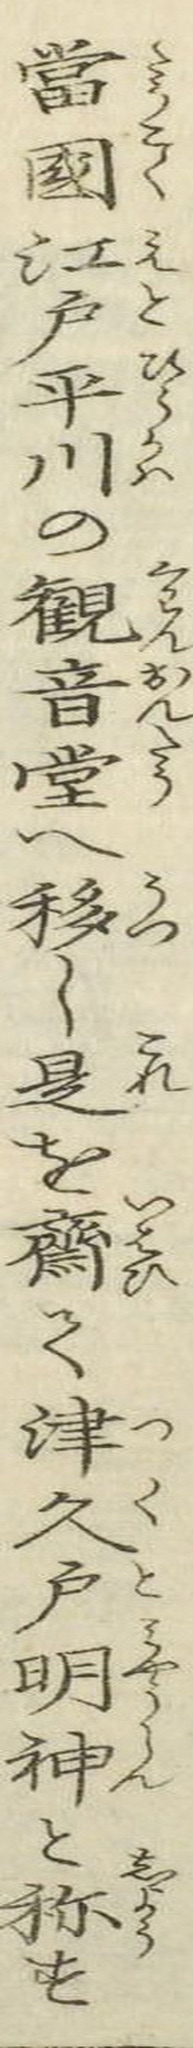当国江戸平川の観音堂へ移し是を斎て津久戸明神と称す
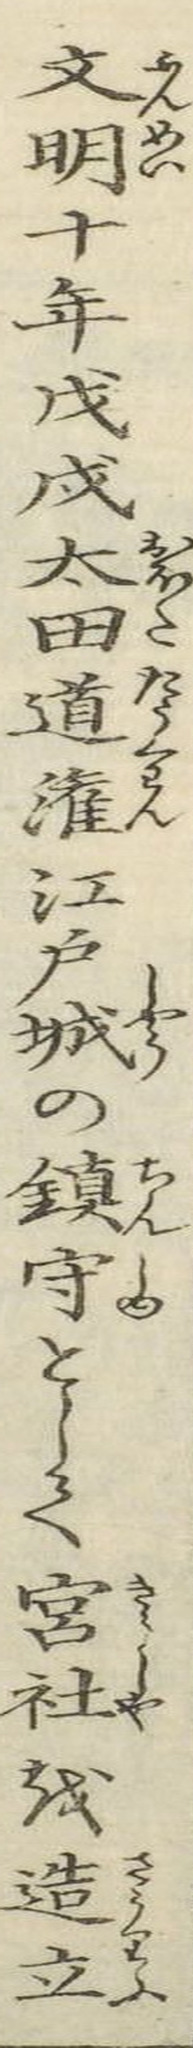文明十年戊戌太田道灌江戸城の鎮守として宮社を造立
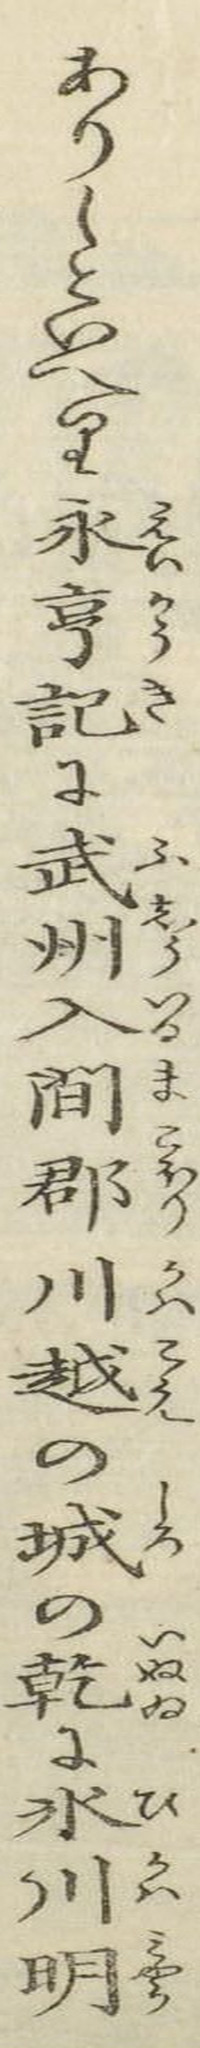ありしといへり永享記）に武州入間郡川越の城の乾に氷川明
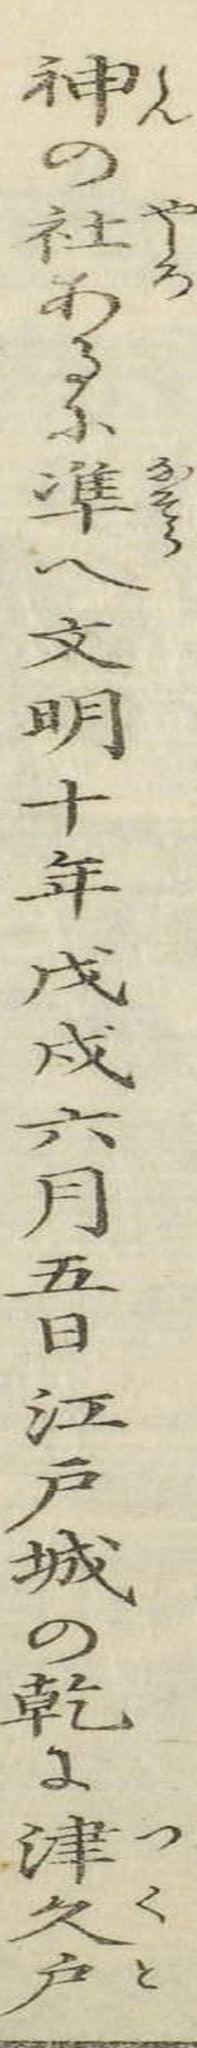神の社あるに準へ文明十年戊戌六月五日江戸城の乾に津久戸
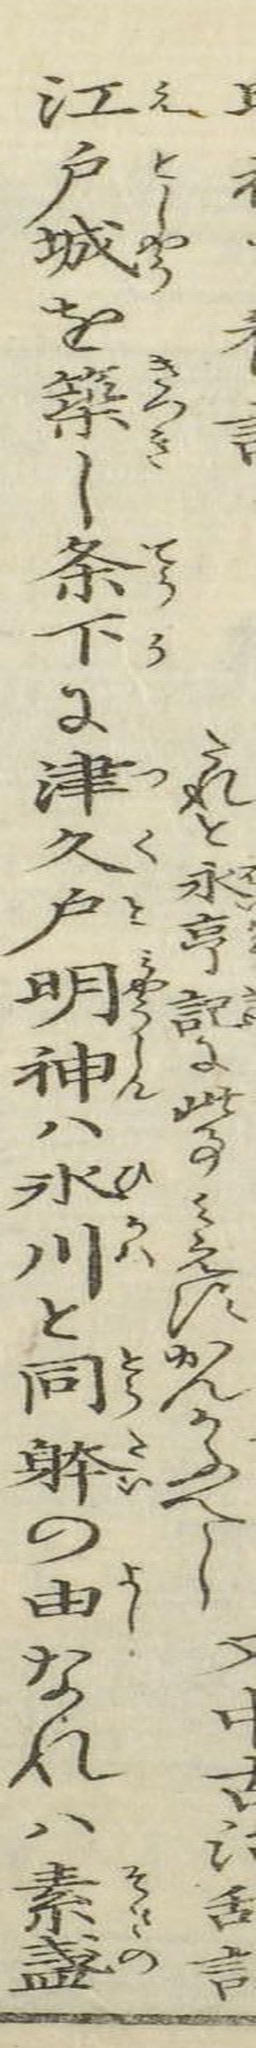江戸城を築し条下に津久戸明神は氷川と同体の由なれは素盞
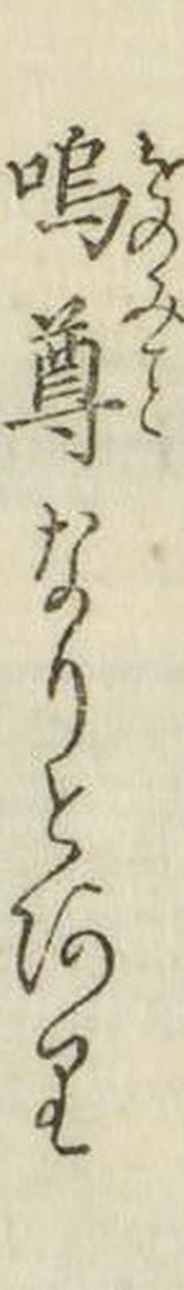鳴尊なりとあり
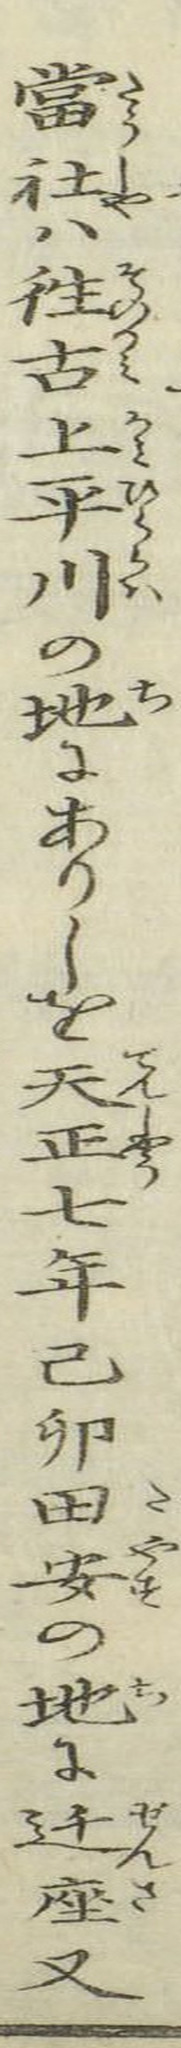当社は往古上平川の地にありしを天正七年己卯田安の地に遷座又
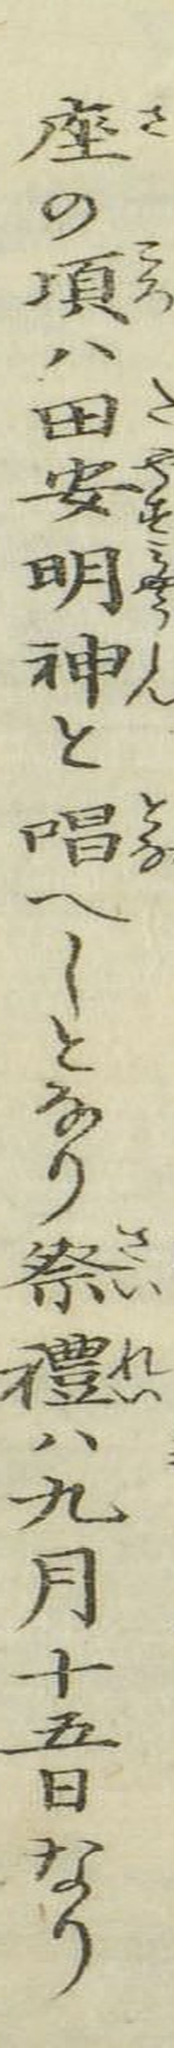座の頃は田安明神と唱へしとなり祭礼は九月十五日なり
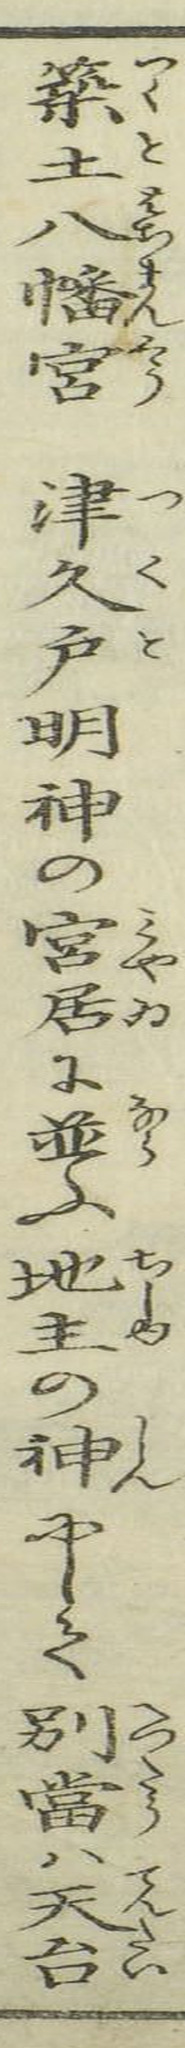築土八幡宮津久戸明神の宮居に並ふ地主の神にして別当は天台

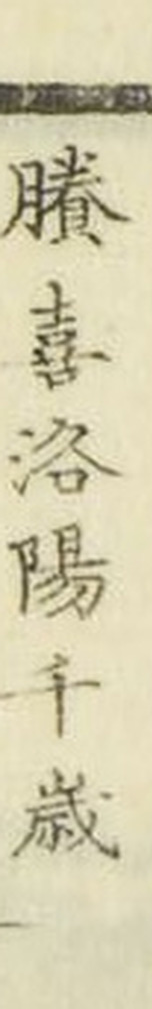賸喜洛陽千歳
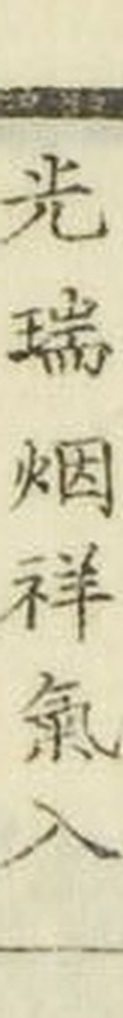光瑞烟祥気入
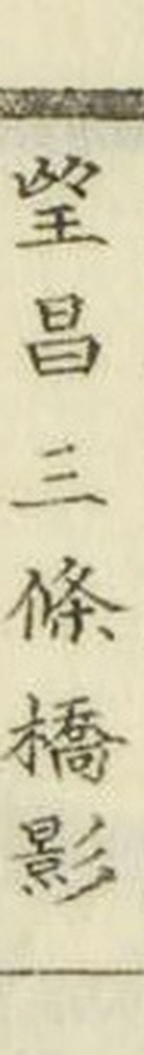望昌三条橋影
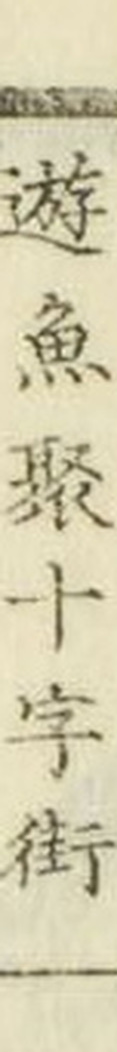遊魚聚十字街
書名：江戸名所図会 20巻 巻之11
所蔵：東京学芸大学教育コンテンツアーカイブ
